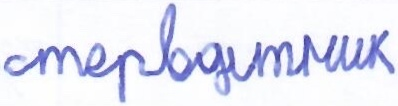стервдипник
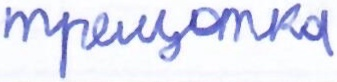трещотка
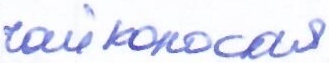чайконосая
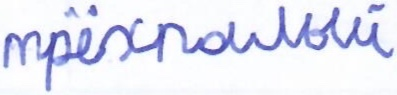трёхпалый
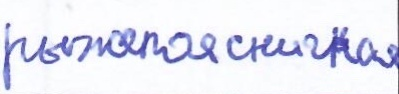рыжепоясничная
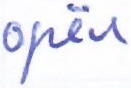орёл
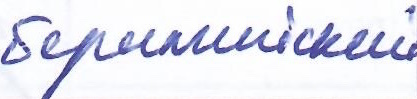берингийский
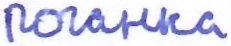поганка
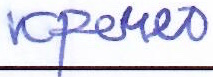кречео
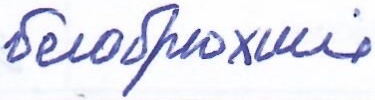белобрюхшй
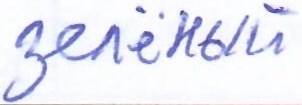зелёный
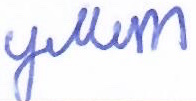улит
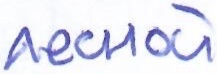лесной
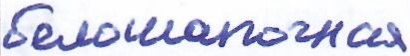белошапочная
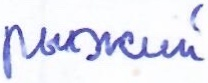рыжий
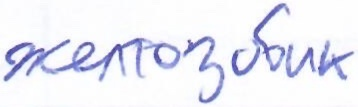желтозобик
